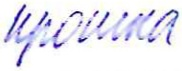крошкя
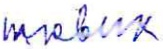тювик
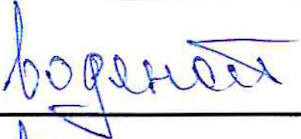водяной
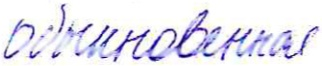обыкновенная
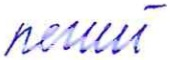пегий
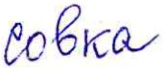совка
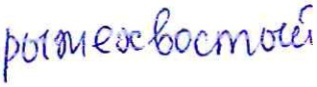рыжехвостый
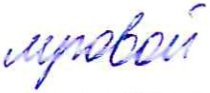луговой
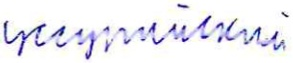уссупийский
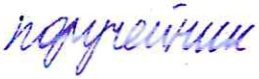поручейник
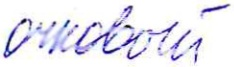очковый
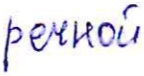речной
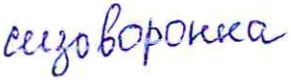сизоворонка
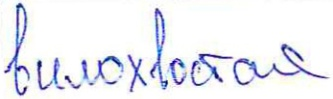вилохвостая
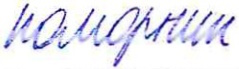поморник
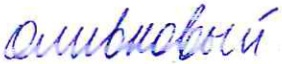оливковый
